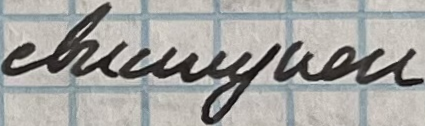свистунок
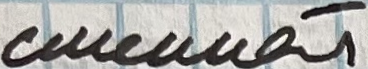степной
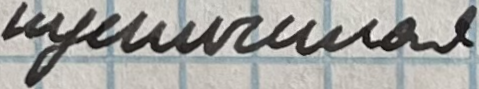пустынная
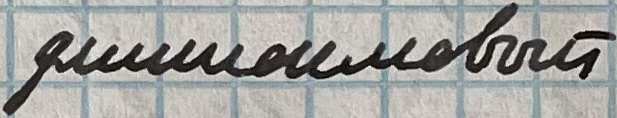длинноклювый
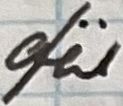орёл
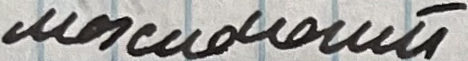мохноногий
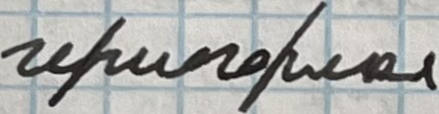черногорлая
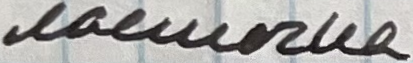ласточка
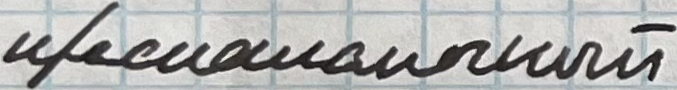красношапочный
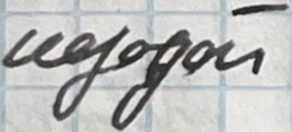козодой
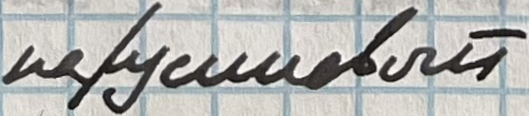парусиновый
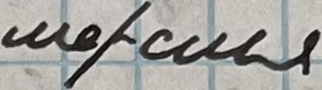морская
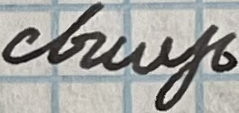свиязь
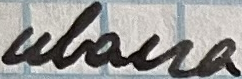иволга
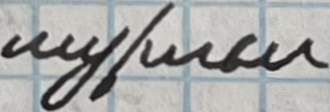турпан
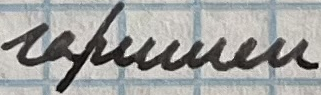гаршнеп
